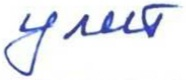улит
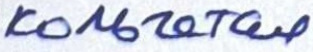кольчатая
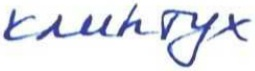клинтух
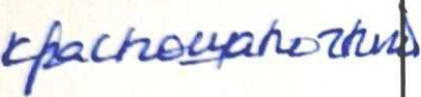красношапочный
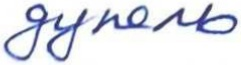дупель
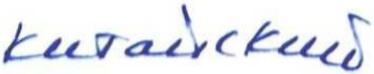китайский
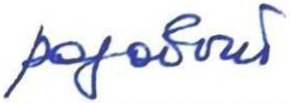розовый
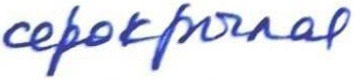серокрылая
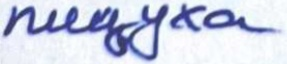пищуха
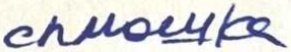сплюшка
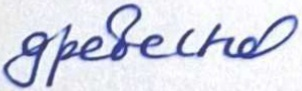древесня
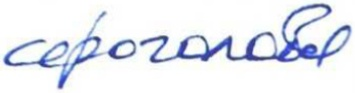сероголовая
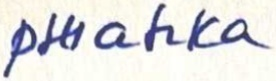ржанка
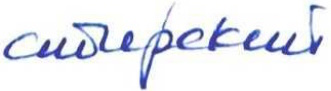сибирский
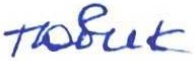тювик
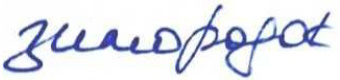зимородок
